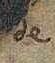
de
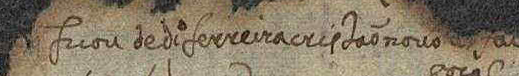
ficou de dio ferreira cristaõ nouo _ fa
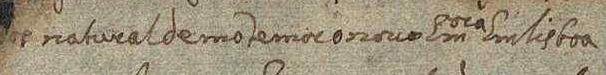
os natural de mōtemor o nouo E mora Em lisboa
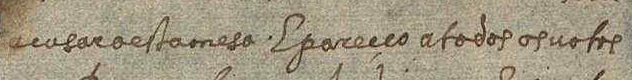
acusar a esta mesa. E pareceo a todos os uotos
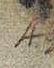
A
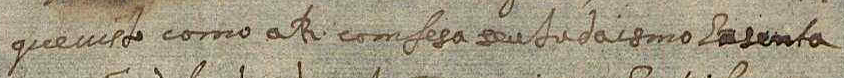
que uisto como a R. comfesa seu Iudaismo e asenta
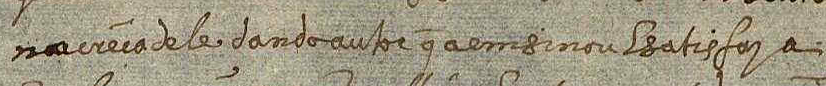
na crēça dele dando autor q̄ a emsinou E satisfaz a
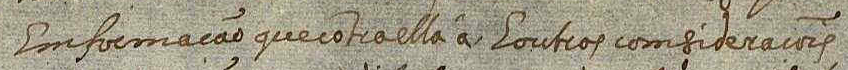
Emformaçaõ que cōtra ella á E outras consideraçoĩs
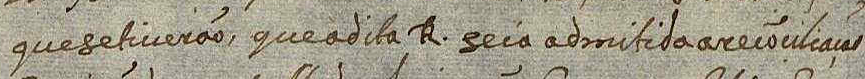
que se tiueraõ, que a dita R. seia admitida a recōciliaçaõ
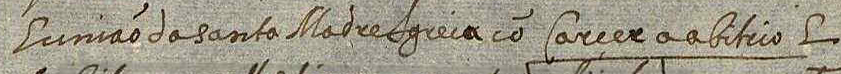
E uniaõ da santa Madre Igreia cō Carcer a abitrio E
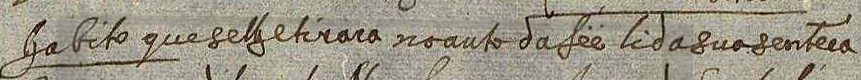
habito que se lhe tirara no auto da fee lida sua sentēça
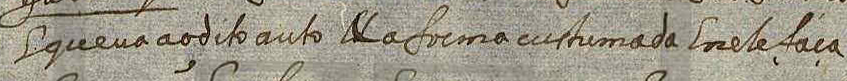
E que ua ao dito auto Na forma custumada E nele faça
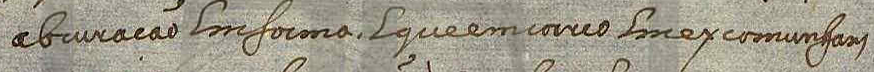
abiuraçaõ Em forma. E que emcorreo em excomunham
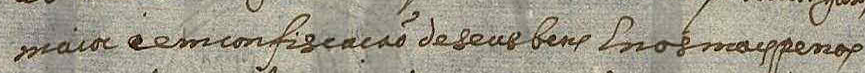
maior e em confiscaçaõ de seus bens e nas mais penas
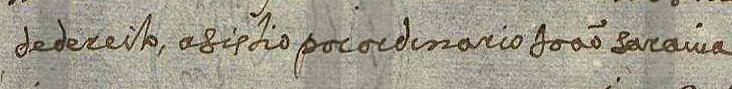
de dereito, asistio por ordenario Joaõ Saraiua
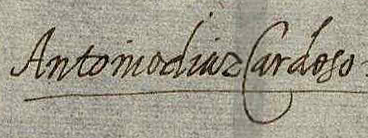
Antonio diaz Cardoso
